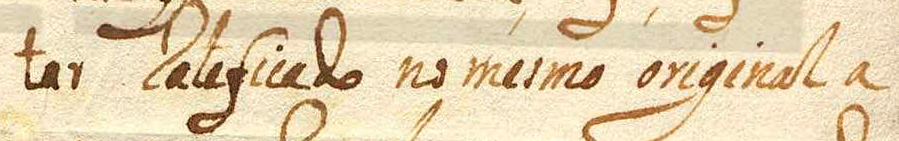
tar Rateficado no mesmo original a
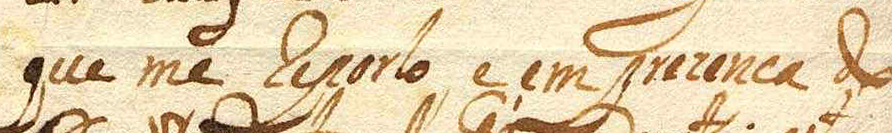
que me Reporto, e em prezença do
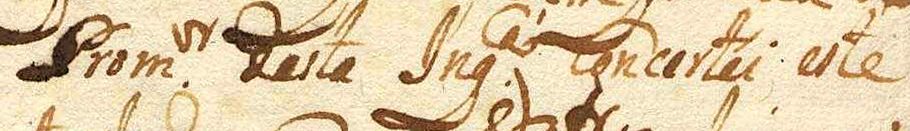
Promor. desta Inq.caõ Concertei este
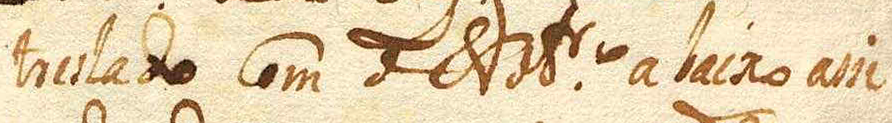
treslado Com o Not.ro abaixo assi
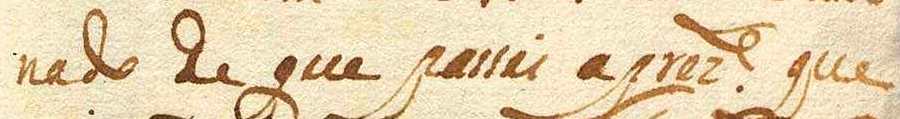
nado de que passei a prez.te que
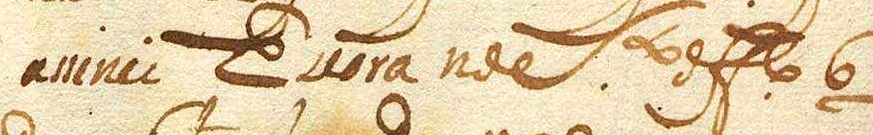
assinei Evora no S.to off.co 6
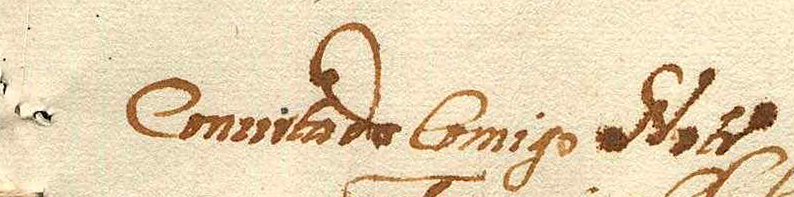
Concertado Comigo Notr.o
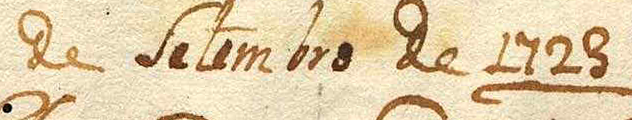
de Setembro de 1723
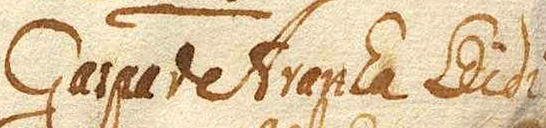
Gaspar de Aranha Vidi
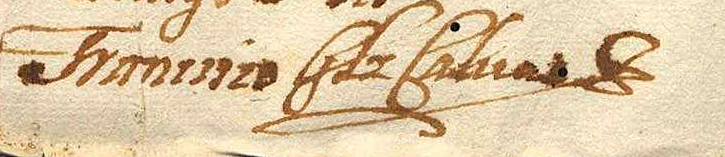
Francisco Glz Caluar
